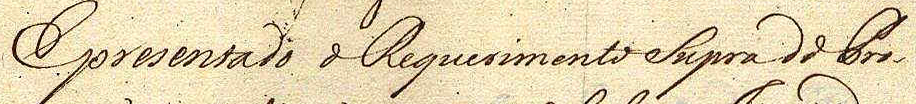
E presentado o Requerimento Supra do Pro
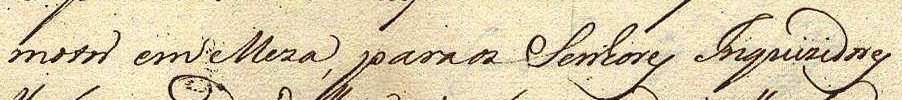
motor em Meza, para os Senhores Inquizidores
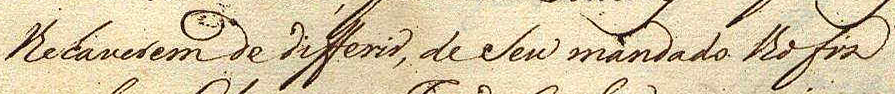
lhe hauerem de differir, de seu mandado lho fiz
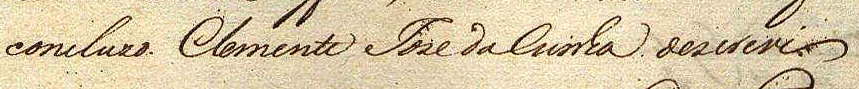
concluzo. Clemente Ioze da Cunha o escrevi
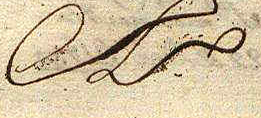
CL.o
